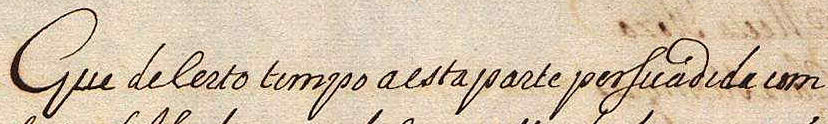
Que de Certo tempo a esta parte persuadida com
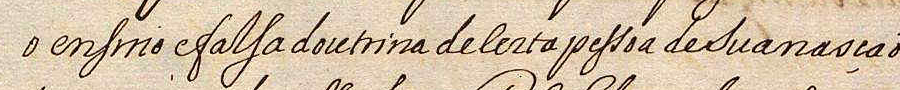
o ensino e falsa doutrina de certa pessoa de Sua nasçaõ
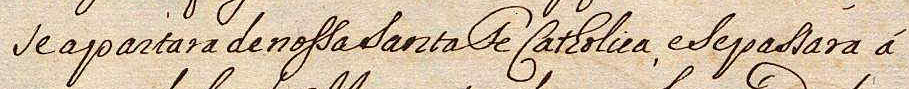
se apartara de nossa Santa Fe Catholica, e Se passara á
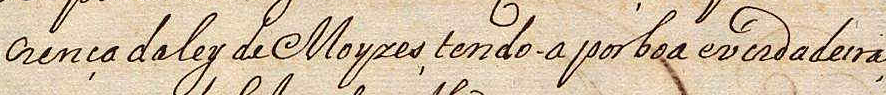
crença da ley de Moyzes, tendo-a por boa e verdadeira,
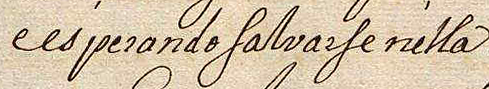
e esperando salvarse nella.
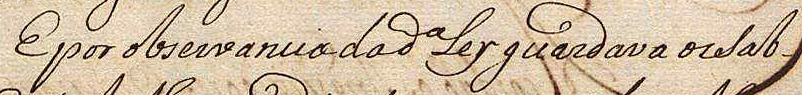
E por observancia da da Ley guardava os Sab
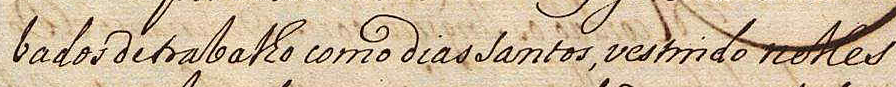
bados de trabalho como dias santos, vestindo nelles
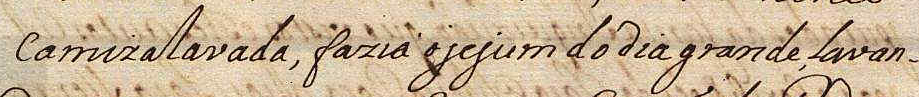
camiza lavada, fazia o jejum do dia grande, Lavan
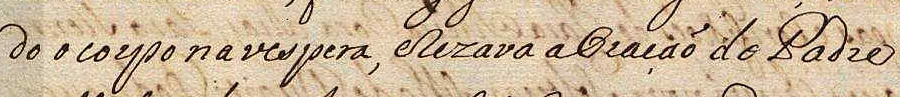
do o corpo na vespera, e Rezava a Oraçaõ do Padre
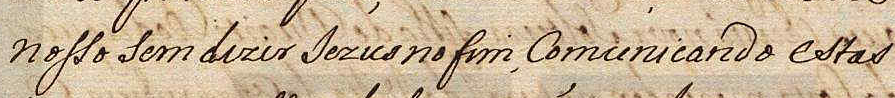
nosso sem dizer Iezus no fim, Comunicando estas
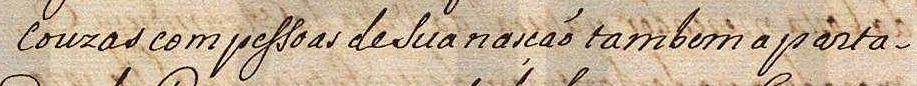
couzas com pessoas de Sua nascaõ tambem aparta
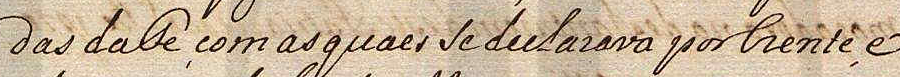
das da Fe, com as quaes se declarava por Crente, e
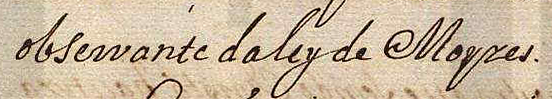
observante da ley de Moyzes.
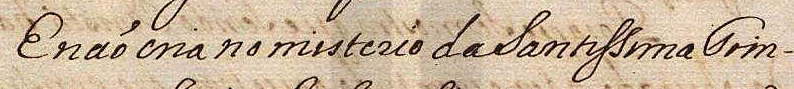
E naõ cria no misterio da Santissima Trin
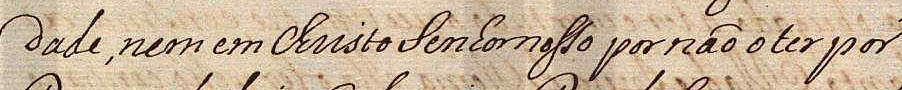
dade, nem em Christo Senhor nosso por não o ter por
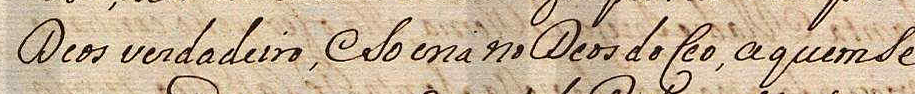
Deos verdadeiro, e So cria no Deos do Ceo, a quem Se
